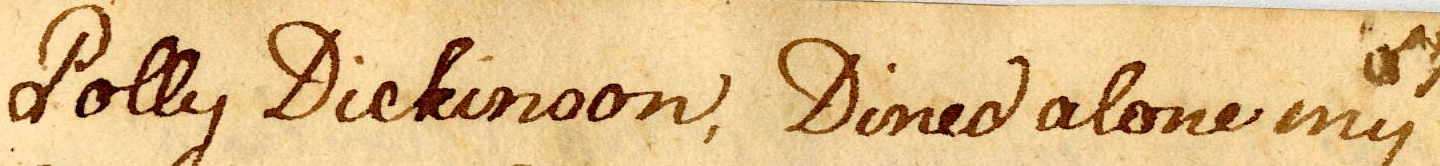Polly Dickinson, Dined alone my
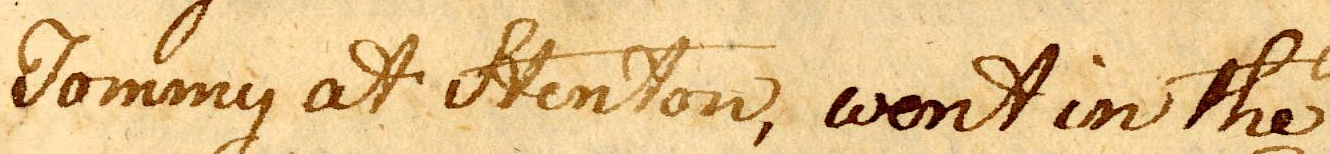Tommy at Stenton, went in the
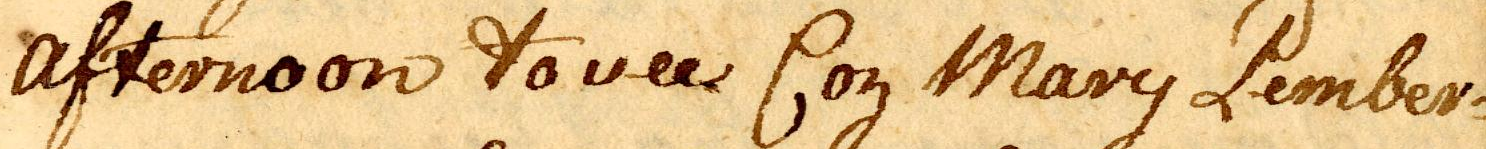Afternoon to see Coz Mary Pember-
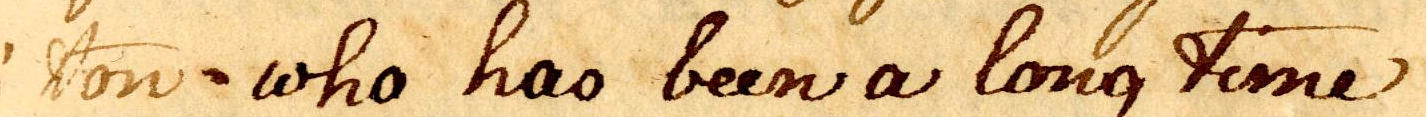-ton- who has been a long time
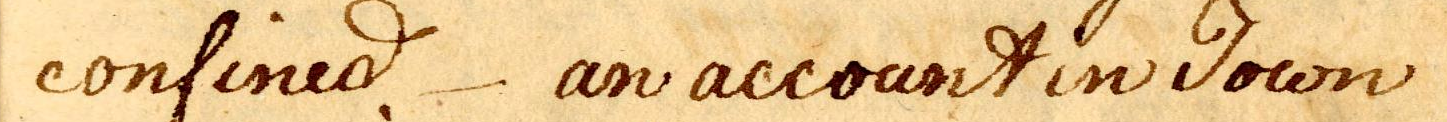confined.- an account in Town
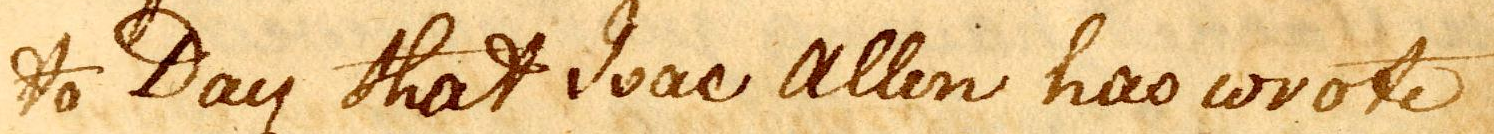to Day that Isac Allen has wrote
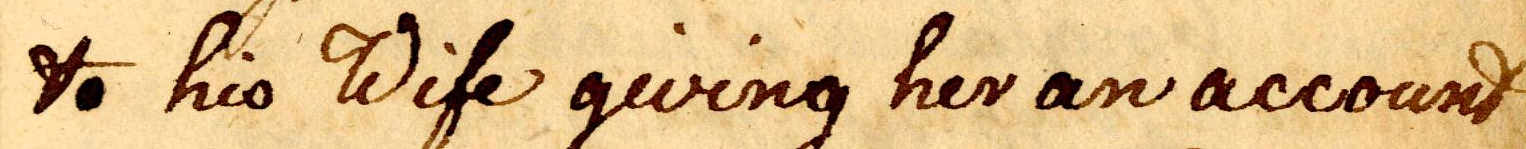to his Wife giving her an account
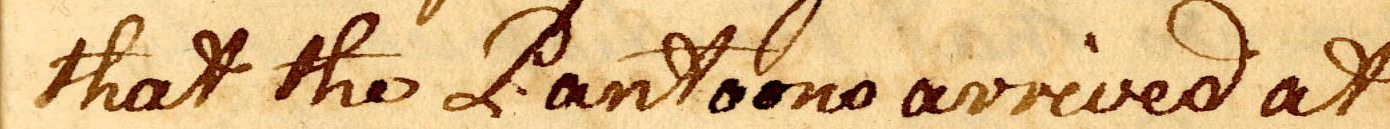that the Pantoons arrived at
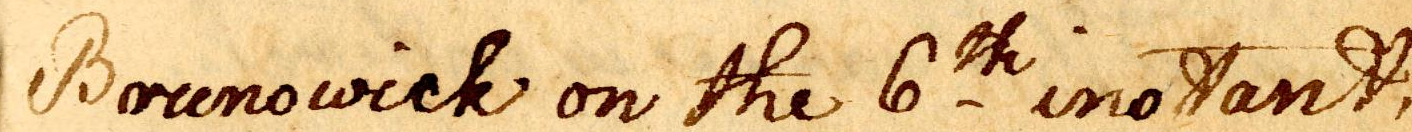Brunswick on the 6^th instant,
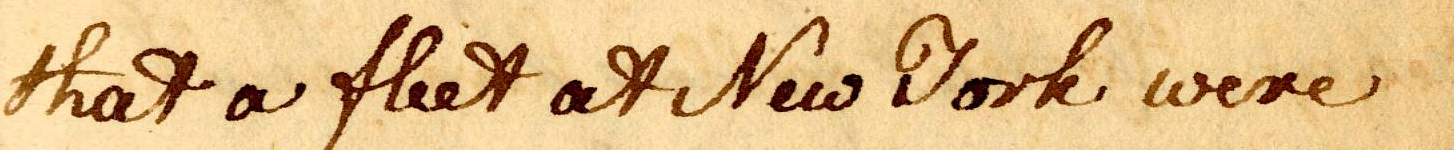that a fleet at New York were
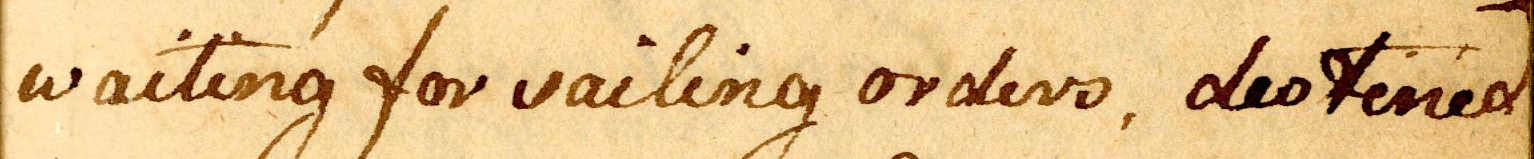waiting for sailing orders, destined
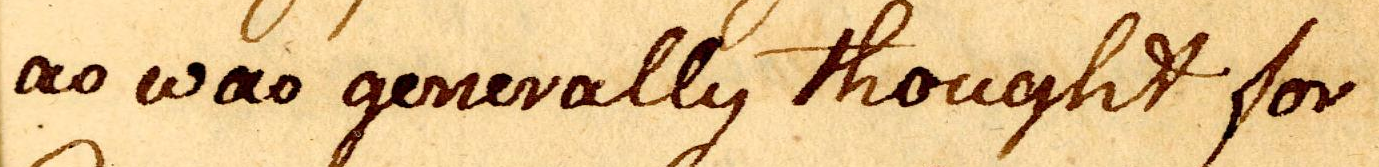as was generally thought for
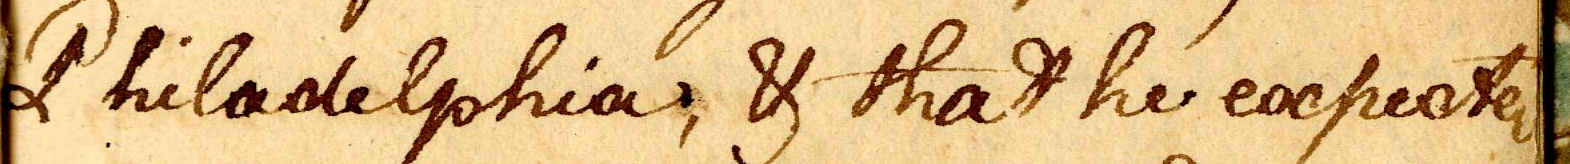Philadelphia, & that he expected
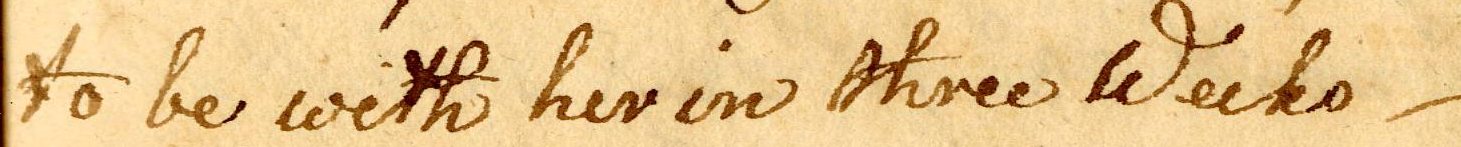to be with her in three Weeks-
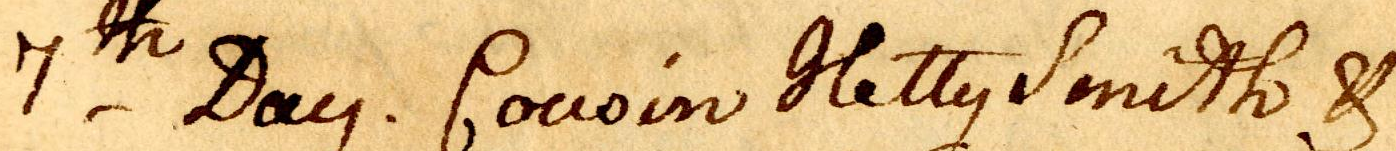7^th Day. Cousin Hetty Smith &
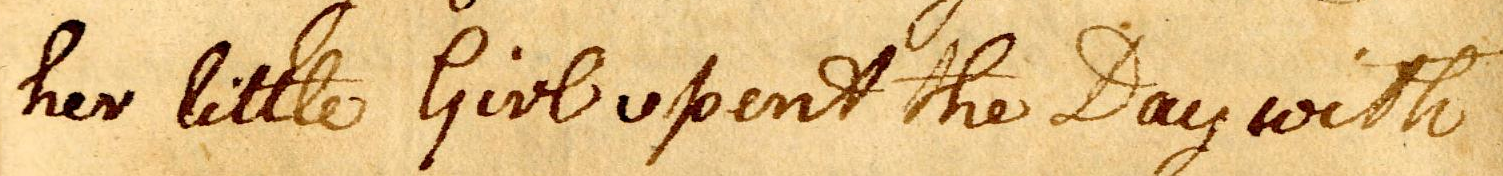her little Girl spent the Day with
